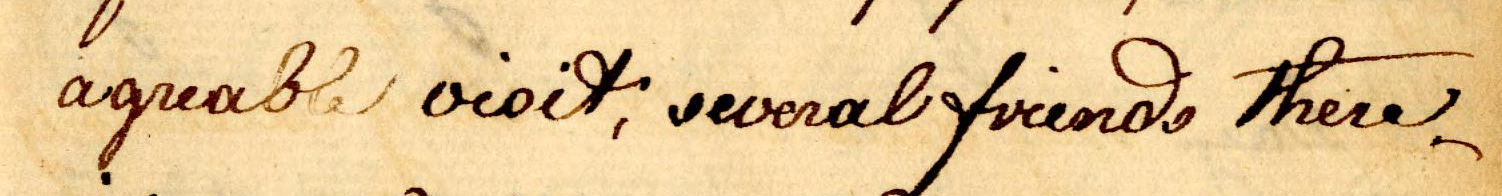agreable visit, several friends there-
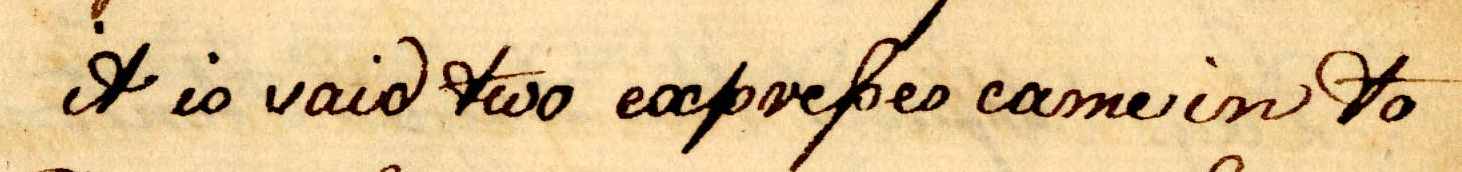it is said two expresses came in to
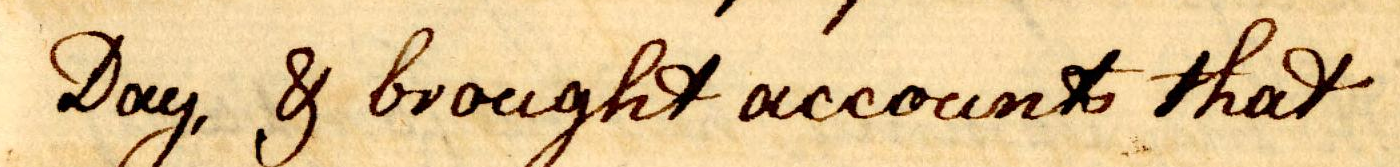Day, & brought accounts that
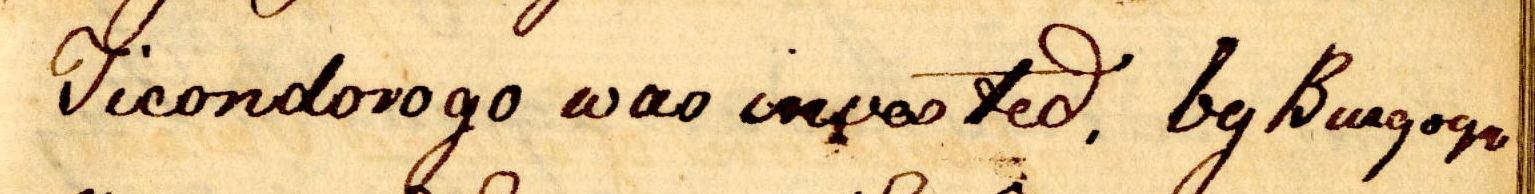Ticondorogo was invested, by Burgoyn
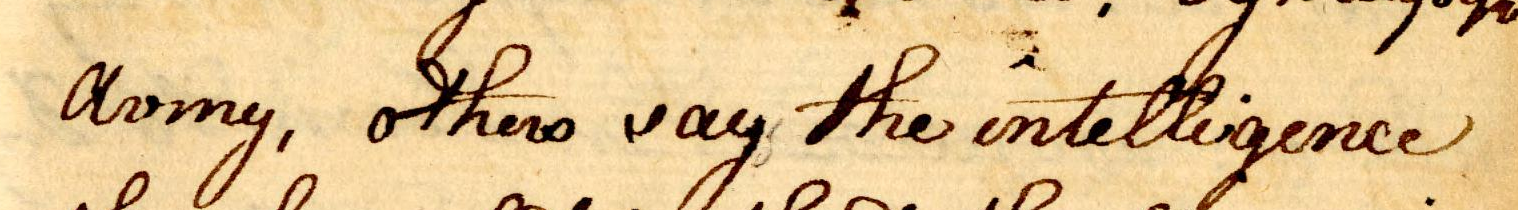Army, others say the intelligence
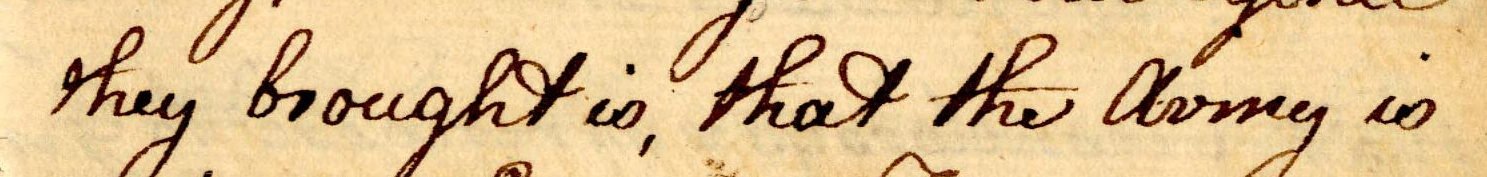they brought is, that the Army is
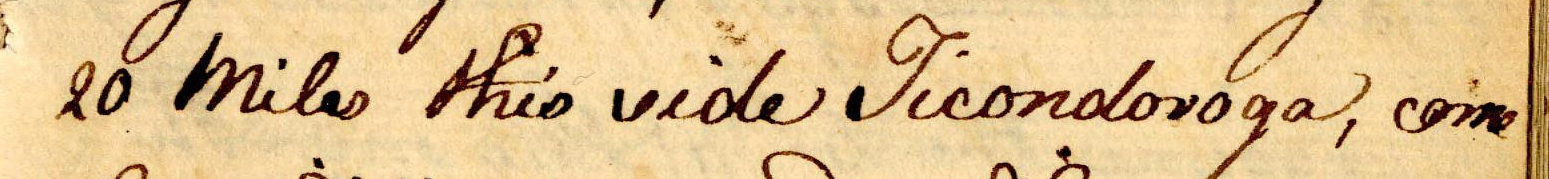20 Miles this side Ticondoroga, come
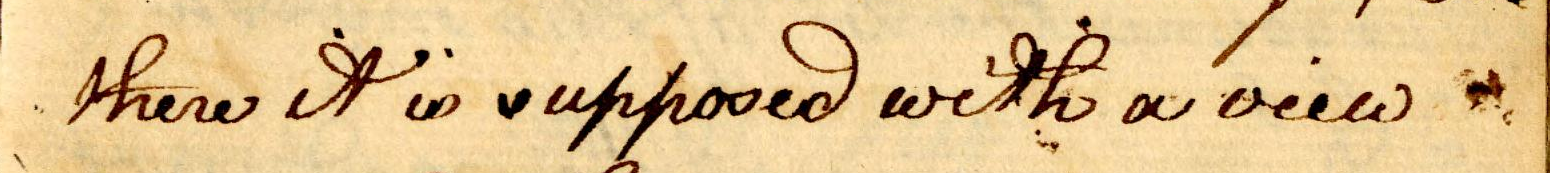there it is supposed with a view
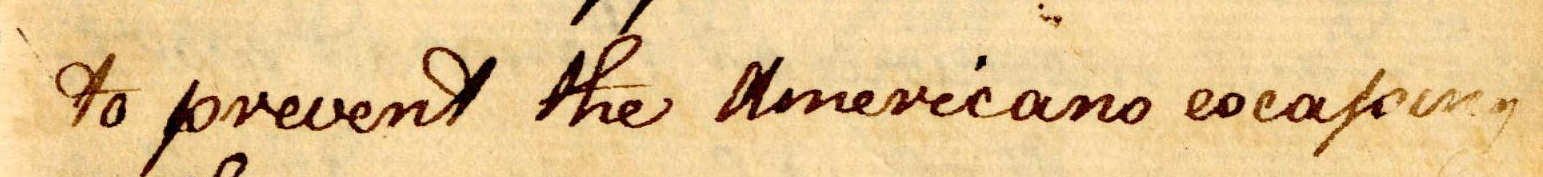to prevent the Americans escaping
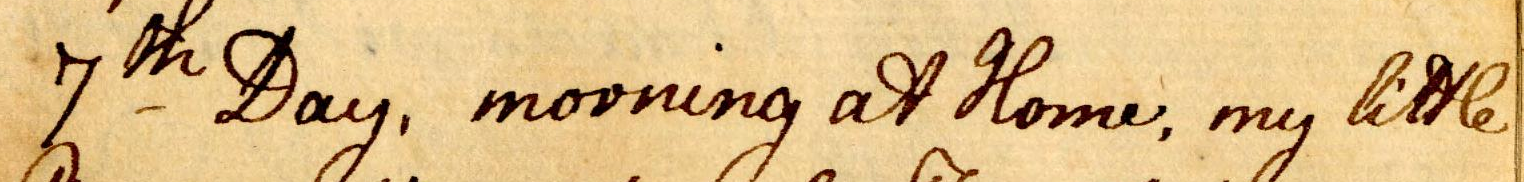7^th Day, morning at Home, my little
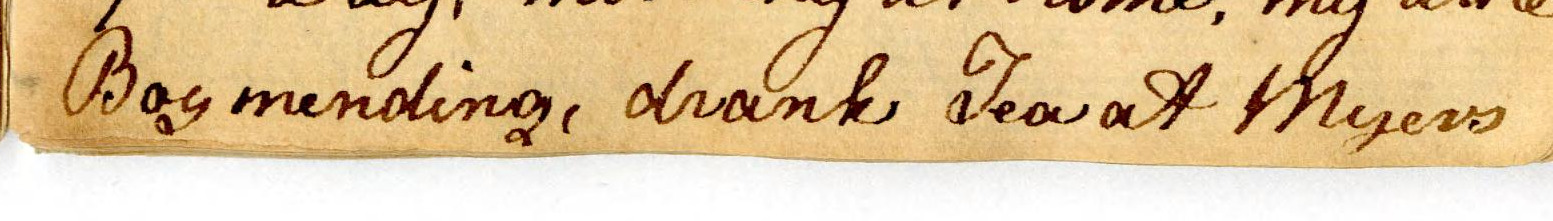Boy mending, drank Tea at Myers
